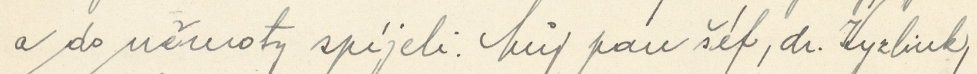a do němoty spíjeli. Můj pan šéf, dr. Kyzlink,
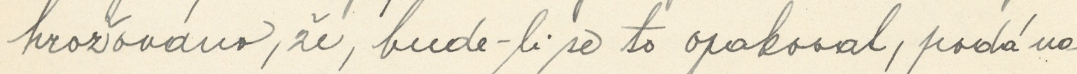hrožováno, že, bude-li se to opakovat, podá na
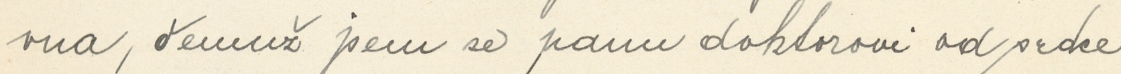vna, čemuž jsem se panu doktorovi od srdce
